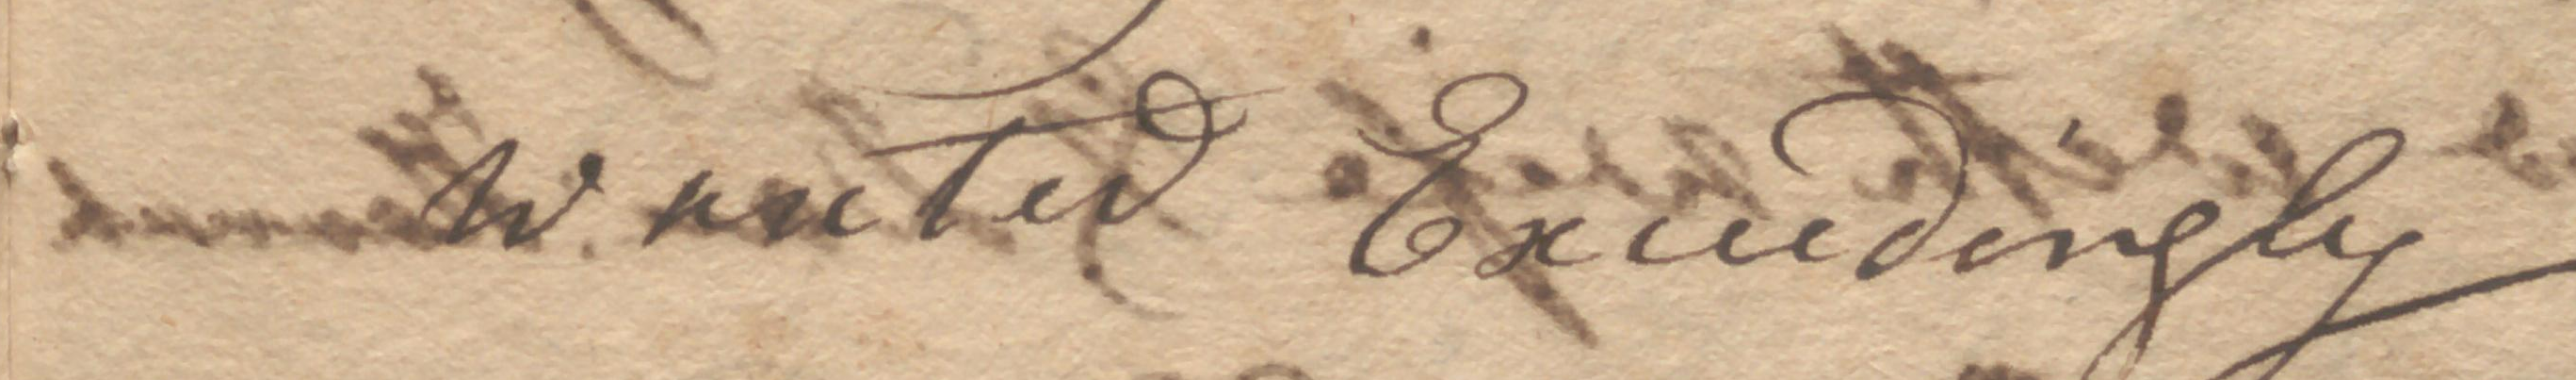Wanted Exceedingly
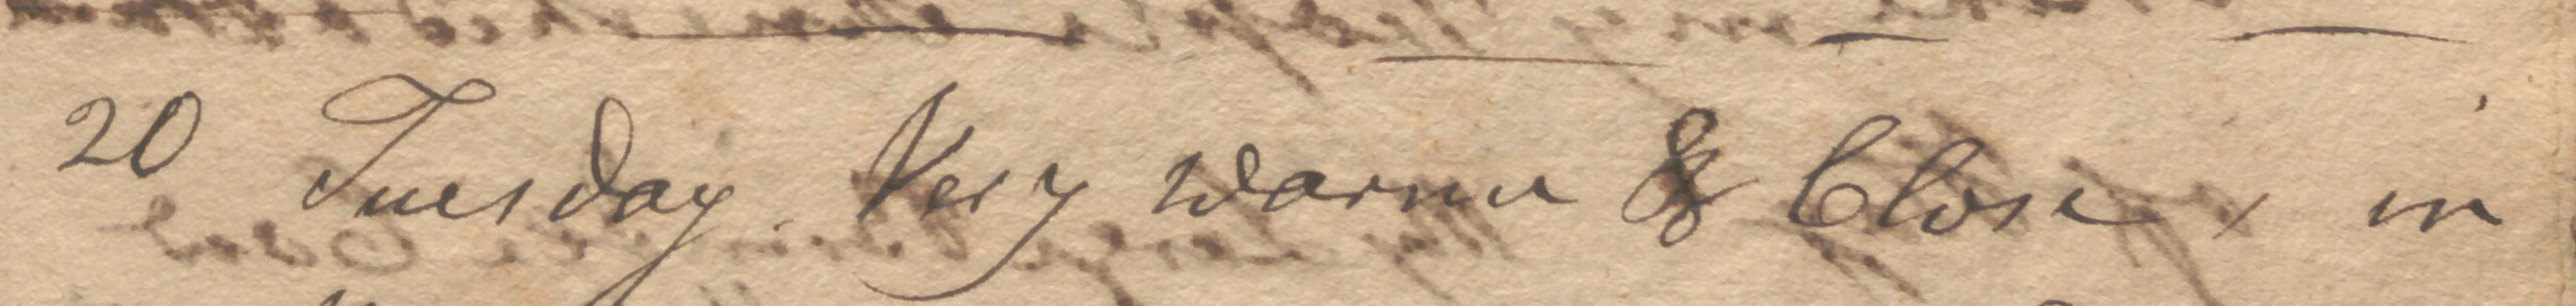20 Tuesday Very warme & Close, in
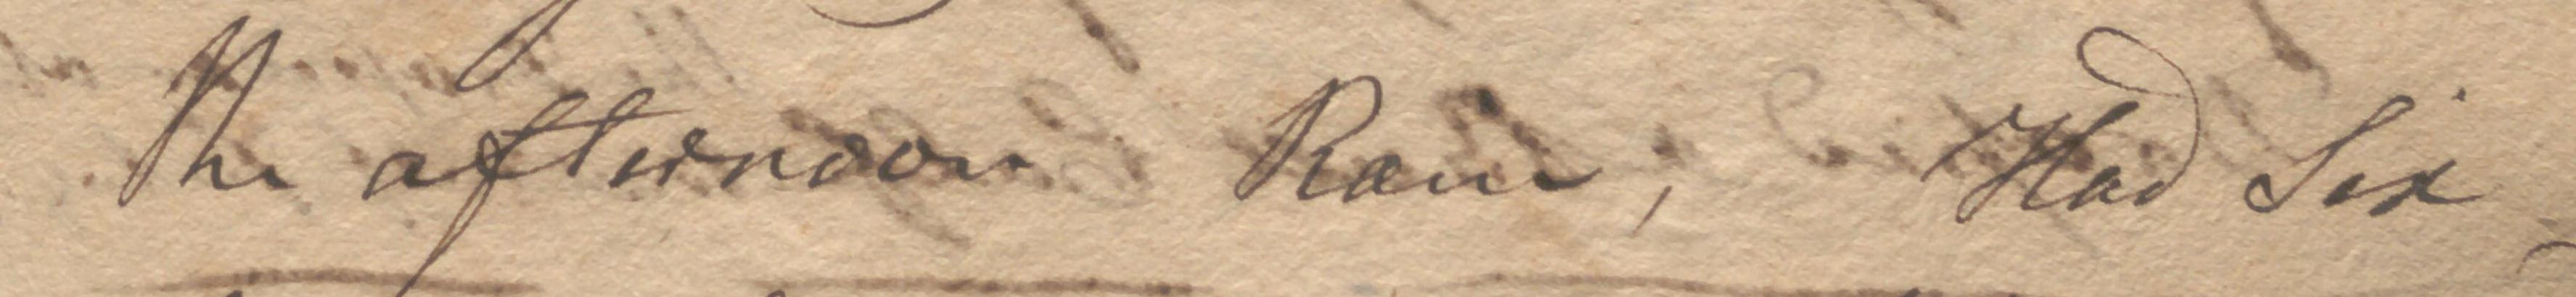the afternoon Rain, Had Six
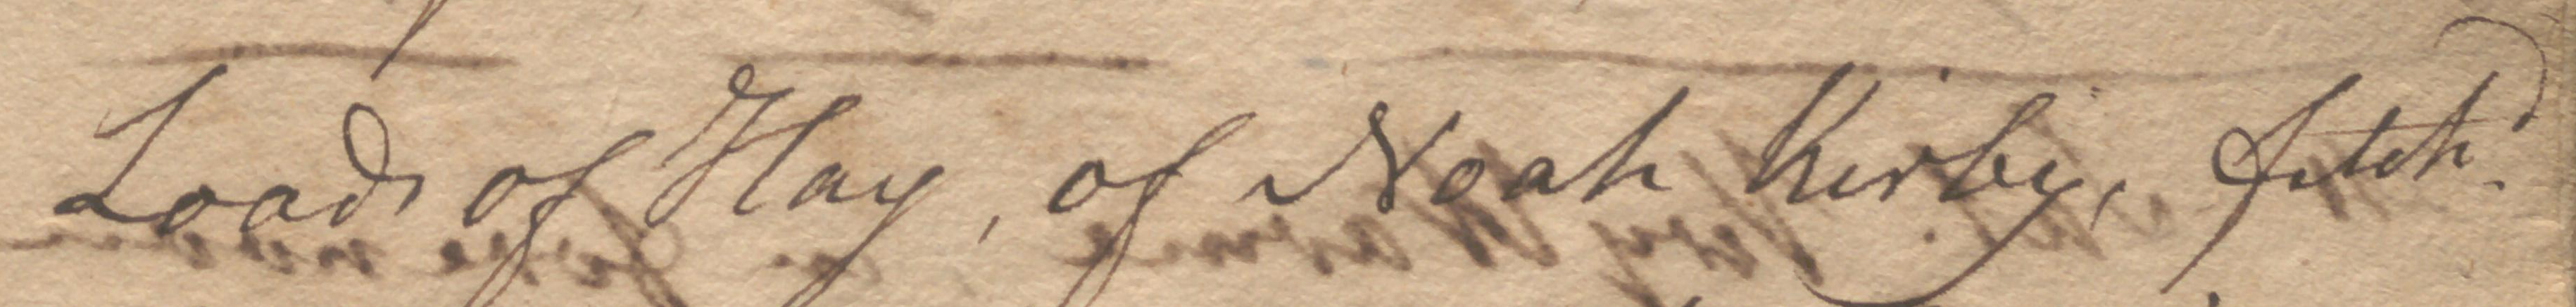Loads of Hay of Noah Kirby, fetch^d
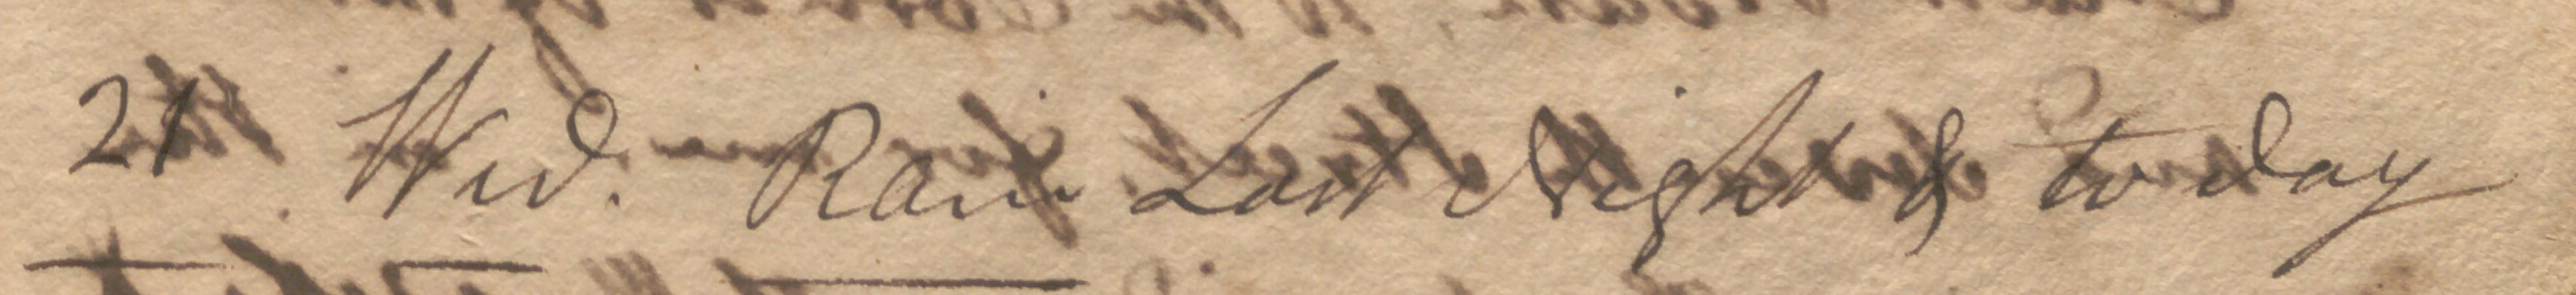21 Wed. Rain Last Night & to day
